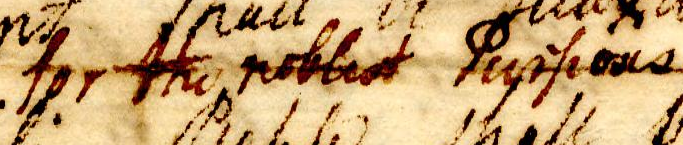for the noblest Passions
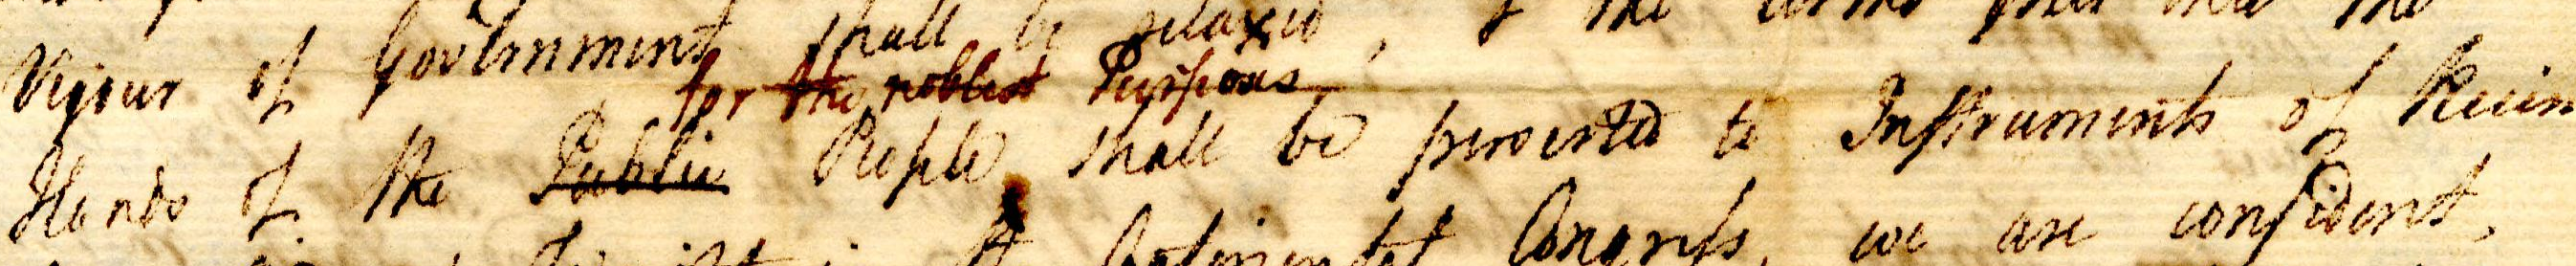Hands of the Public People ^ shall be perverted to Instruments of Ruin
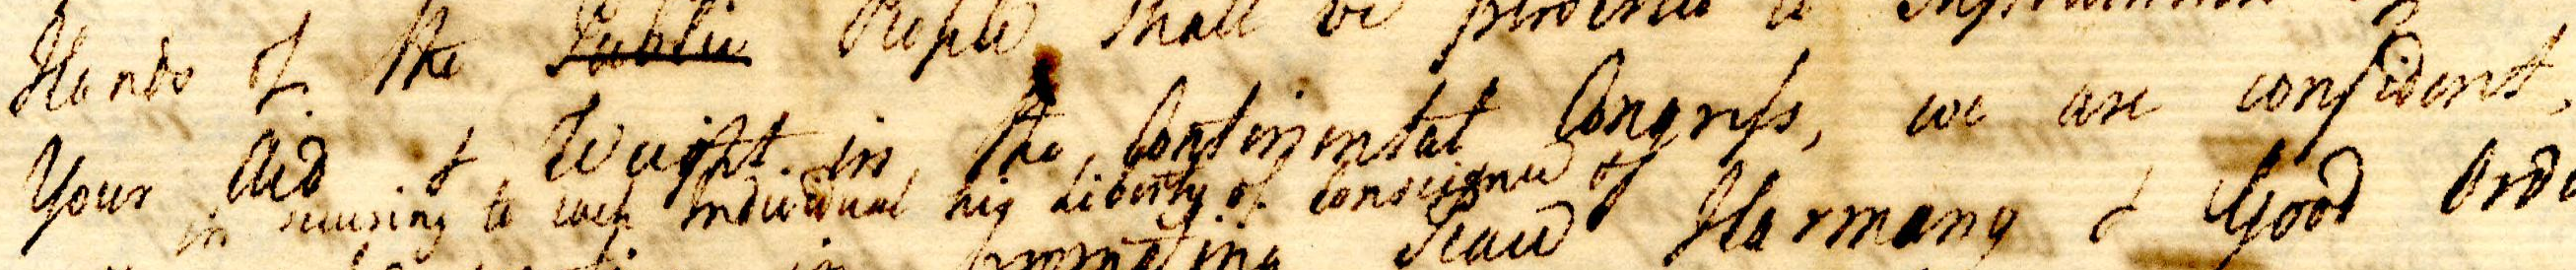Your Aid & Weight in the Continental Congress, we are confident
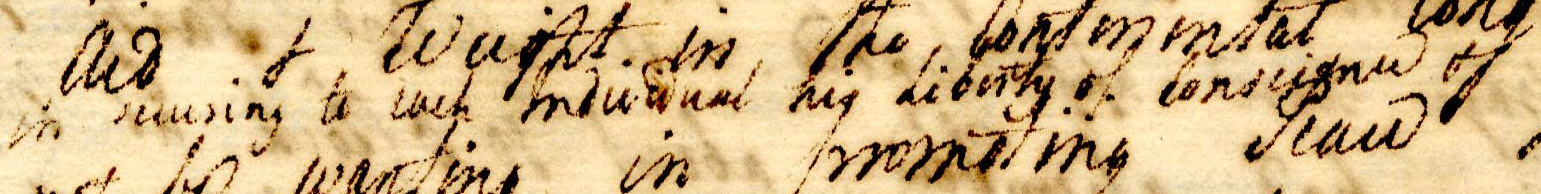in [___]ing to such Individual his Liberty of Conscience of
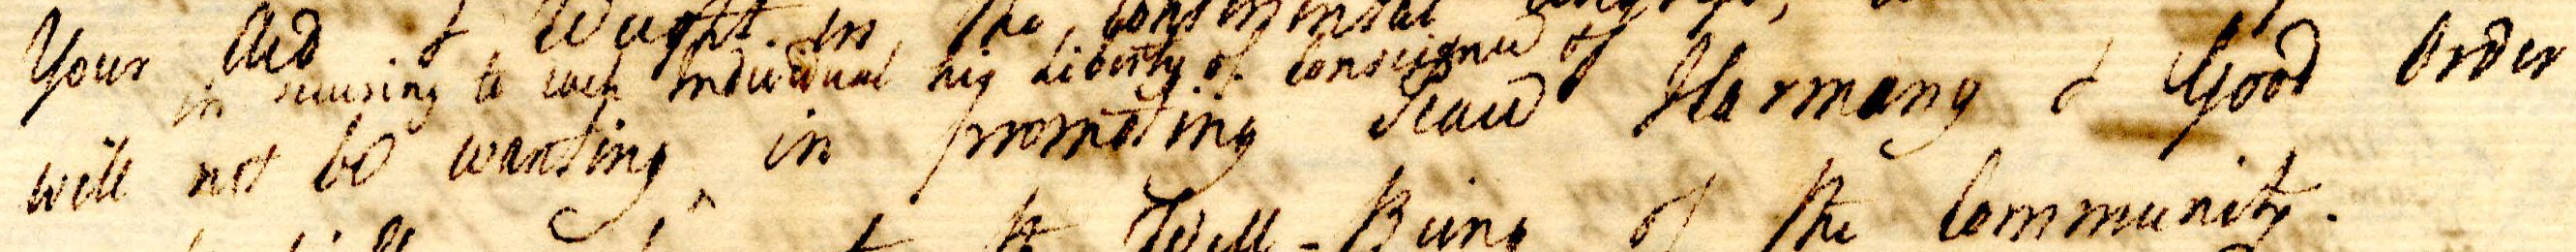will not be wanting ^ in promoting Peace Harmony & Good Order
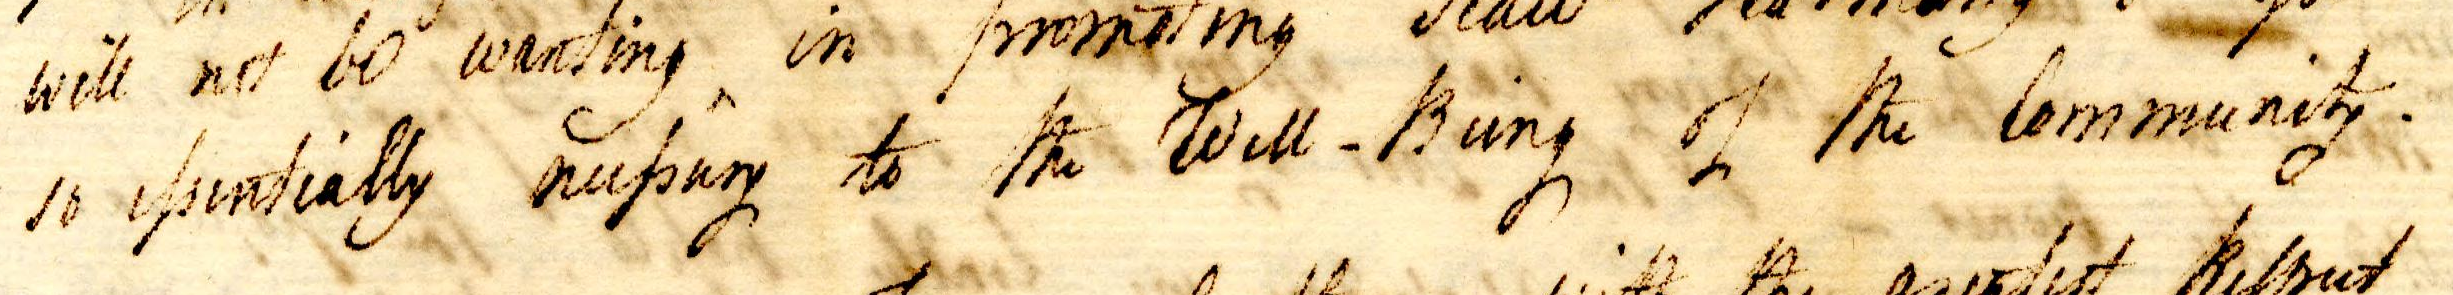so essentially necessary to the Well-Being of the Community.
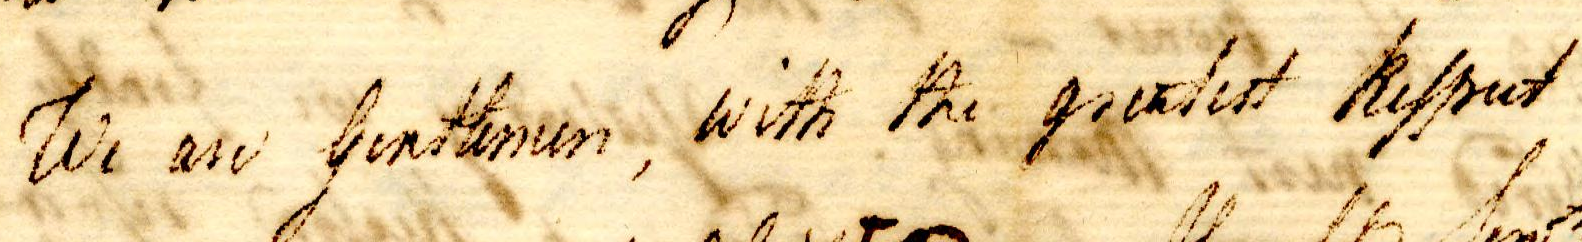We are Gentlemen, with the greatest Respect
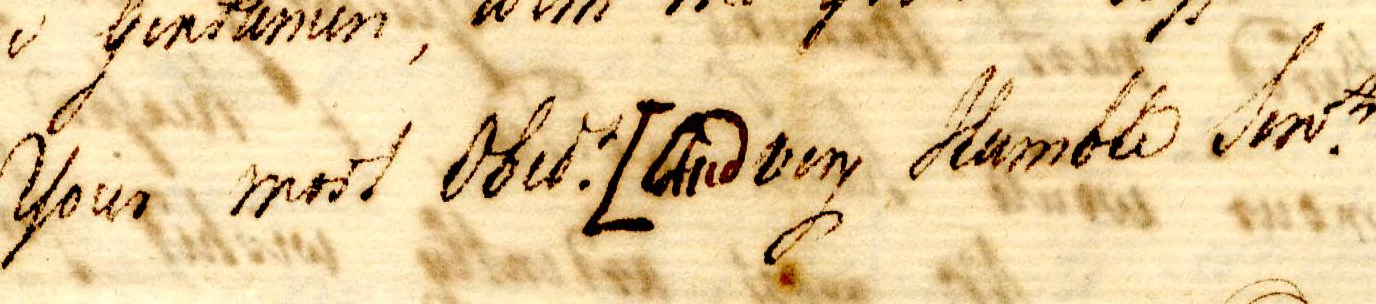Your most Obed^t. and very Humble Serv^t.
